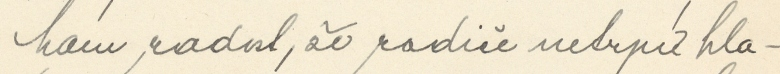Mám radost, že rodiče netrpí hla-
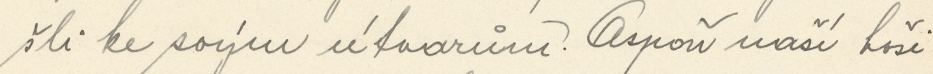šli ke svým útvarům. Aspoň naší hoši
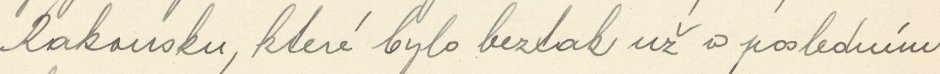Rakousku, které bylo beztak už v posledním
